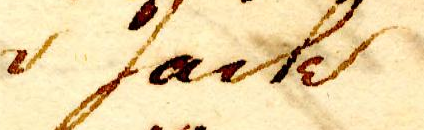v Jack
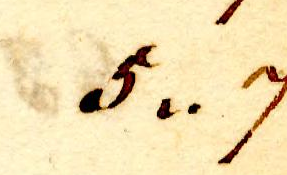5..7
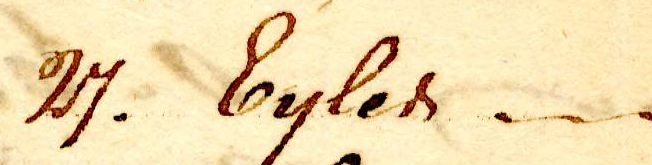27. Eyler
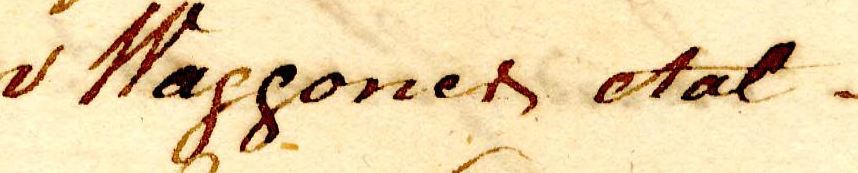v Waggoner et al
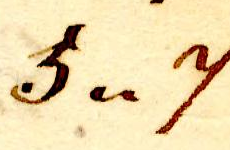5 .7
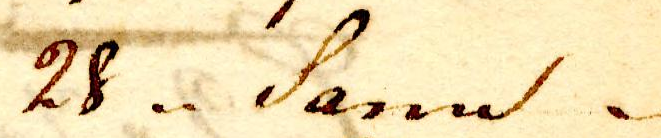28. Same
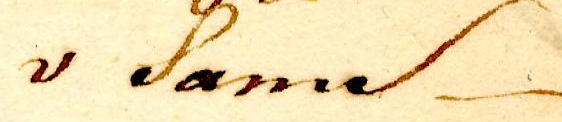v Same
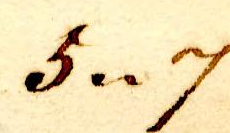5..7
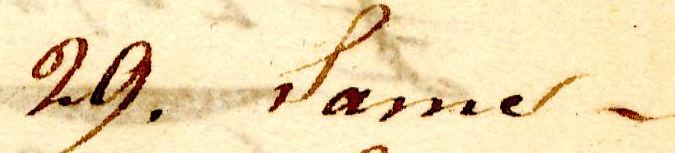29. Same
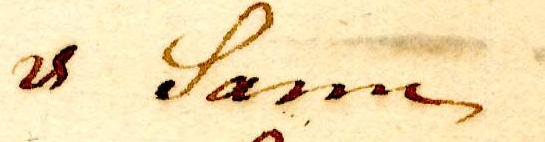v Same
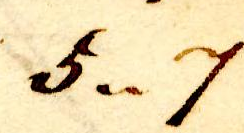5.7
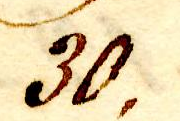30.
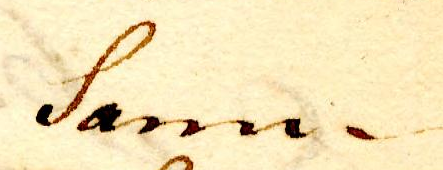Same
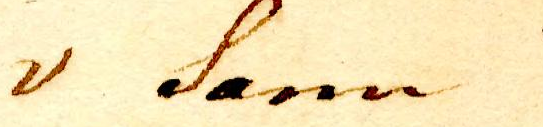v Same
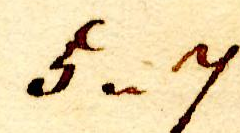5.7
